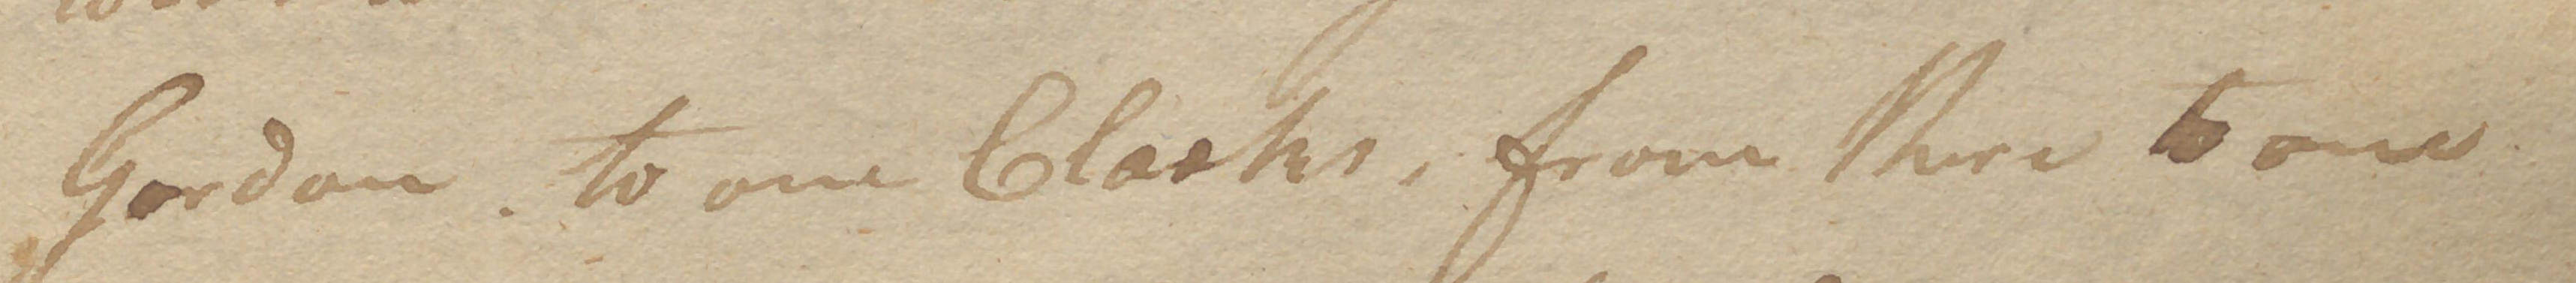Gordon to one Clocks, from there to one
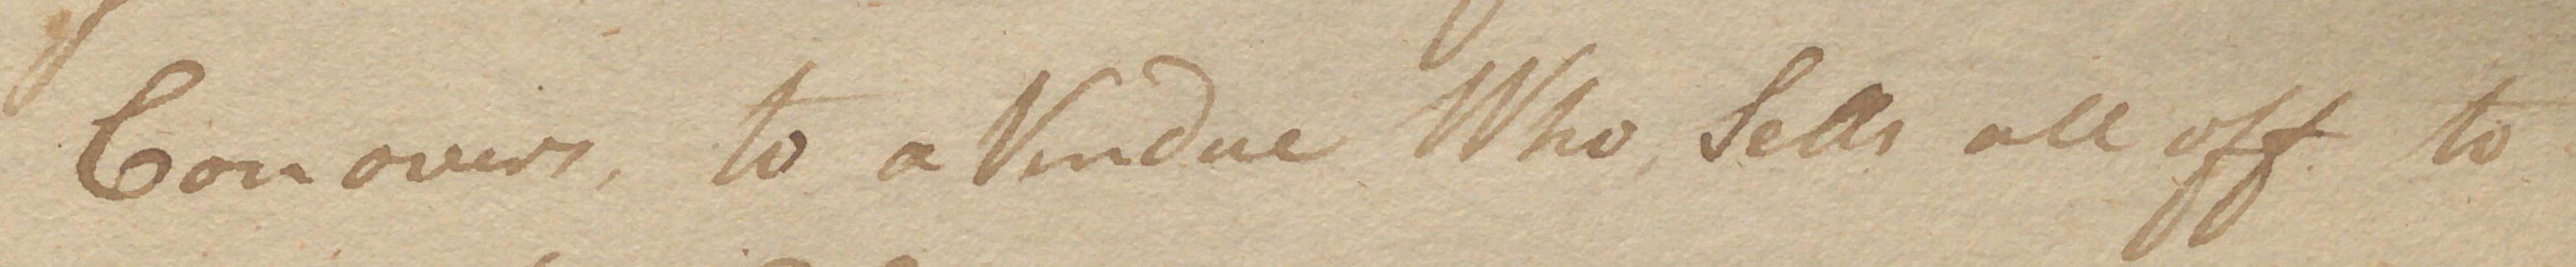Conovers to a Vendue Who Sells all off to
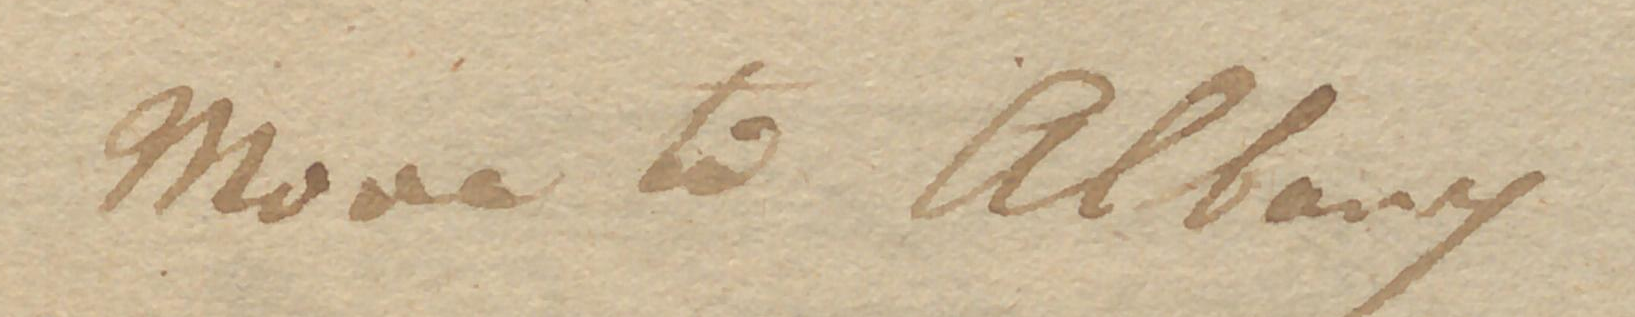Move to Albany
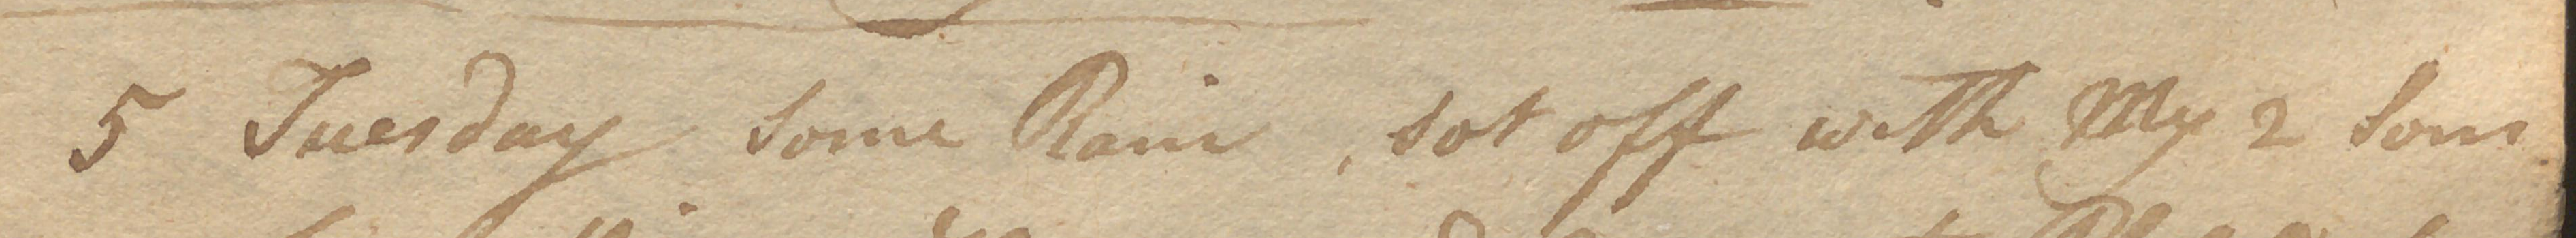5 Tuesday some Rain, sot off with My 2 sons
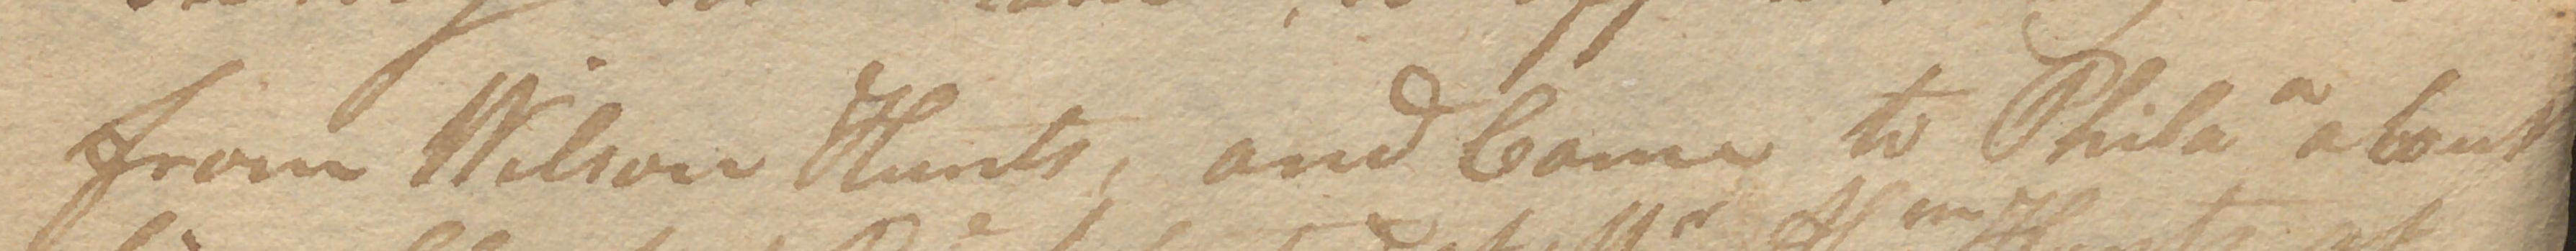from Wilson Hunts, and Came to Phila^a. about
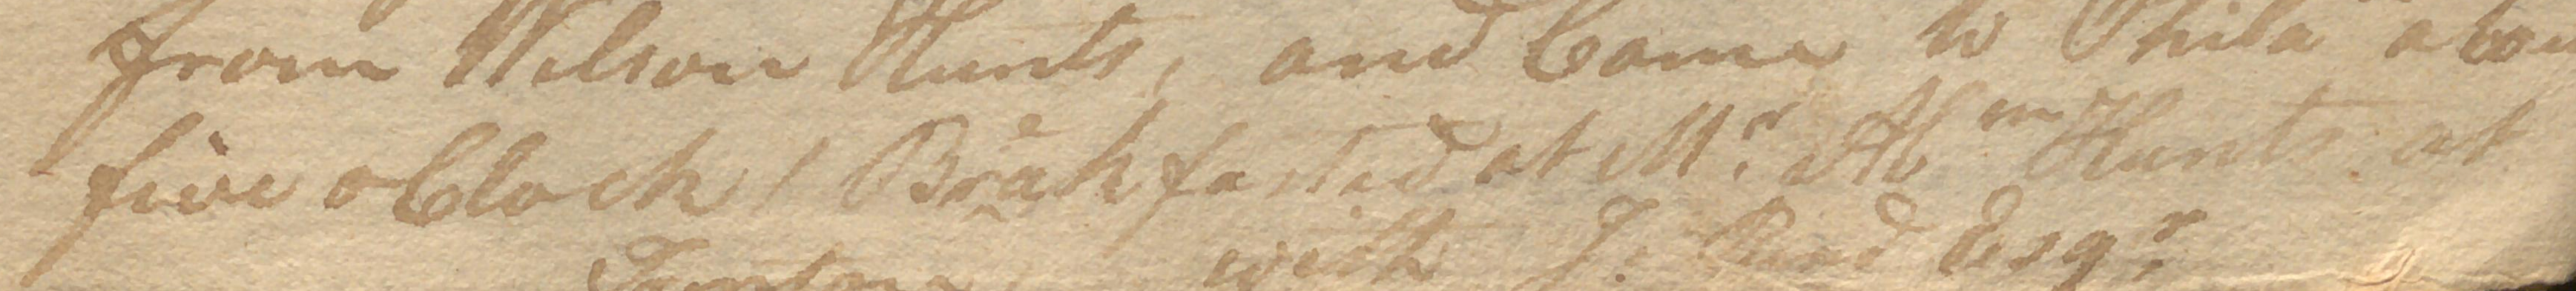five o Clock Br^eakfasted at M^r. Ab^m. Hunts at
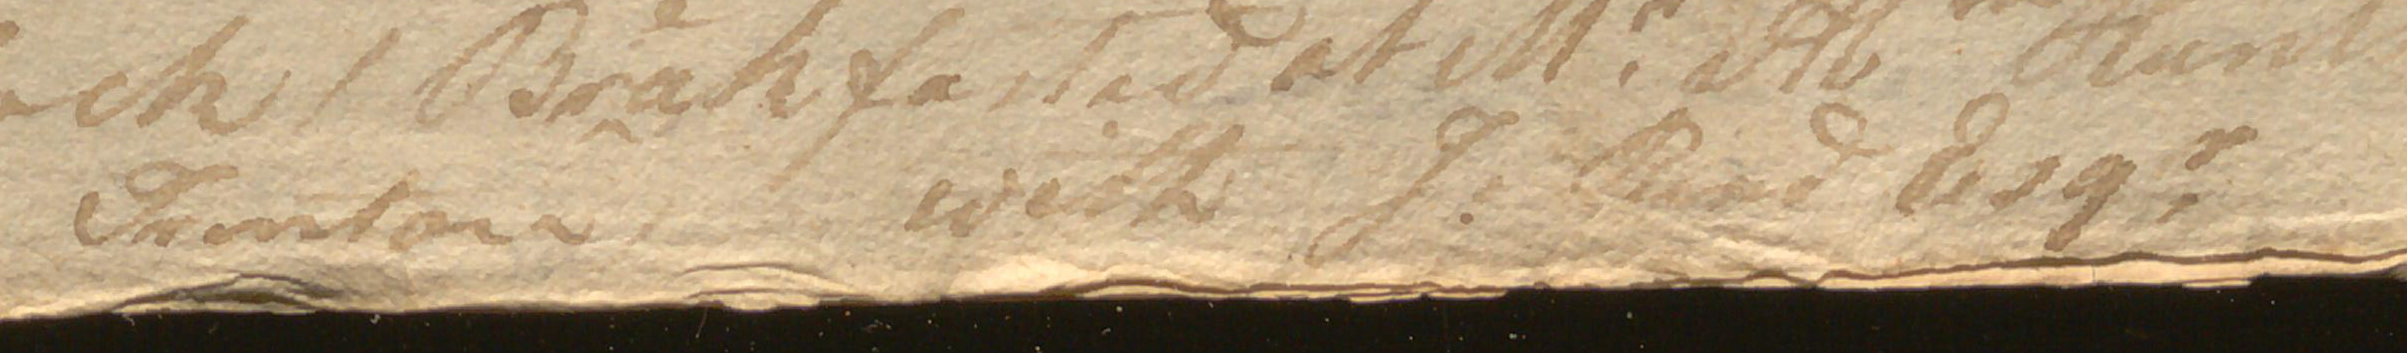Trenton, with J. Read Esq^r.
